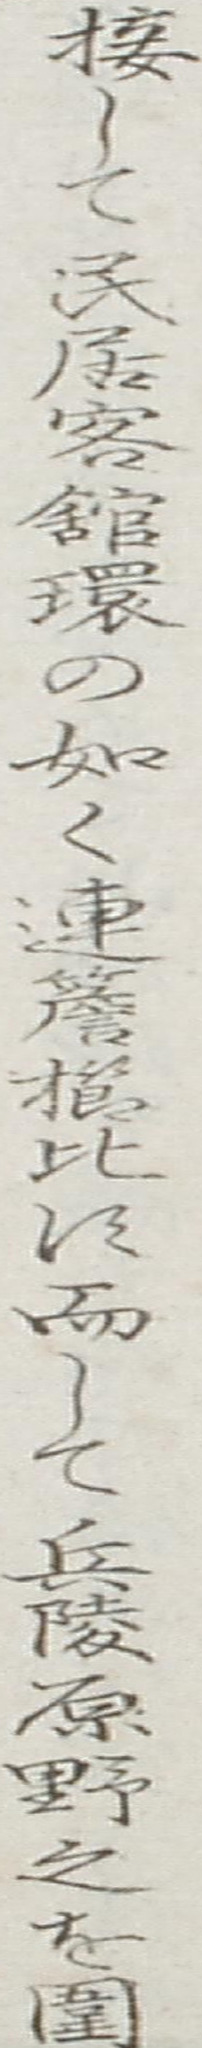接して民居舘環の如く連簷櫛比す而して兵陸原野之を囲
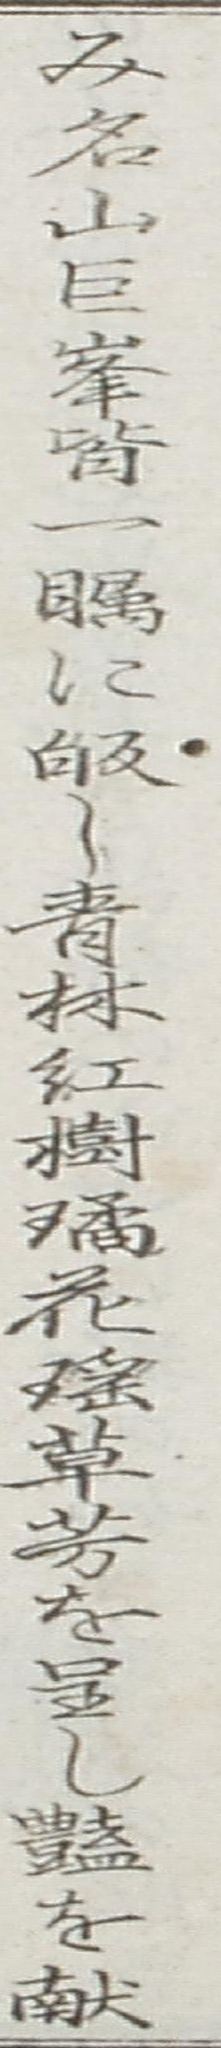み名山巨峯皆一瞩に皈し青林紅樹橘花瑶草芳を呈し豔を献
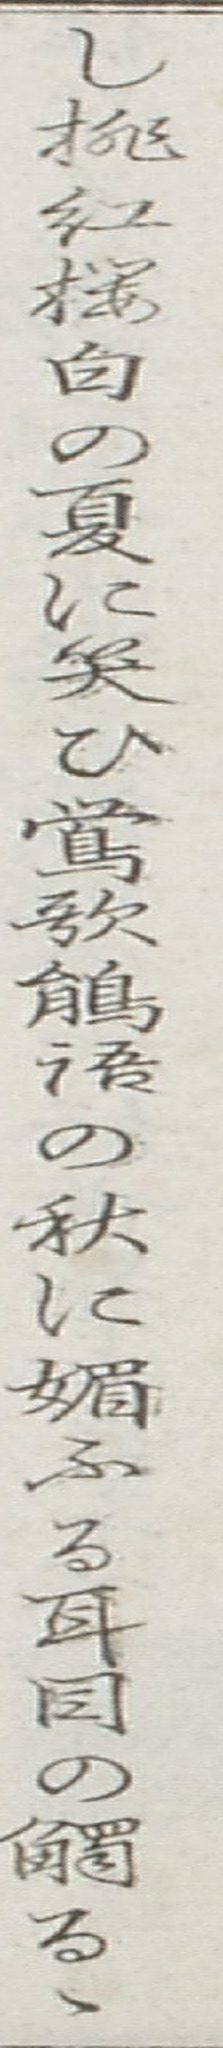し桃紅桜白の夏に笑ひ鴬歌鵑語の秋に媚ふる耳目の触るゝ
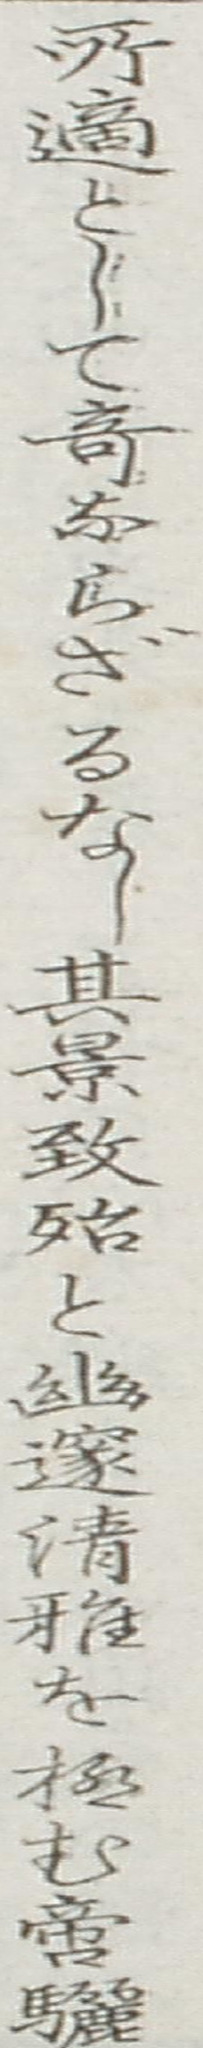所適としてならざるなし其景致殆と幽邃清雅を極む啻驪
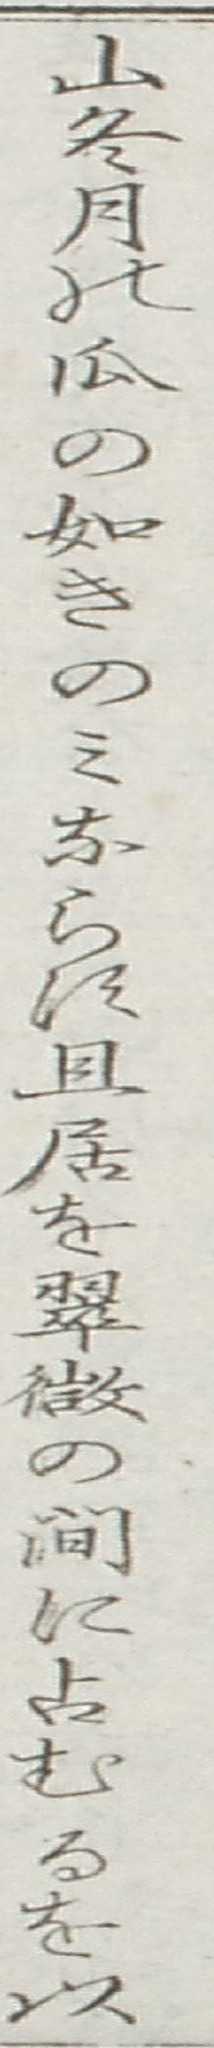山冬月の瓜の如きのみあらす且居を翠徴の間占むるを以
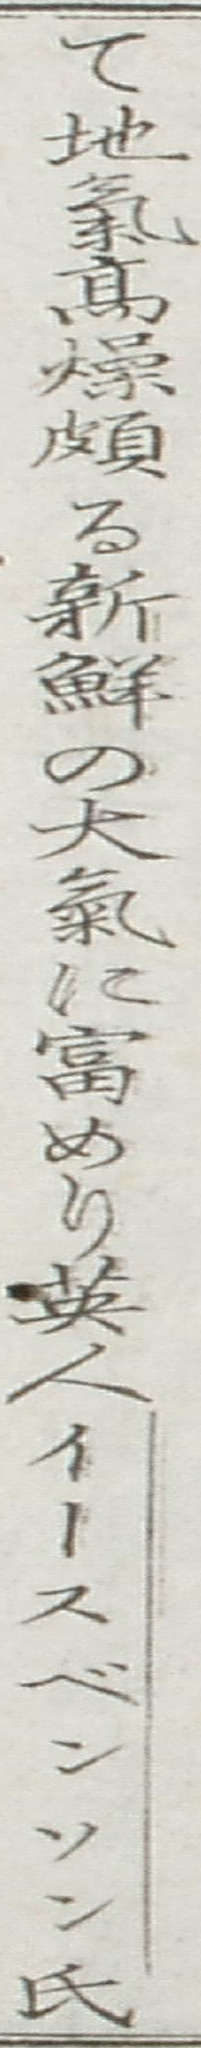て地気高燥頗る新鮮の大気に富めり英人イースベンソン氏
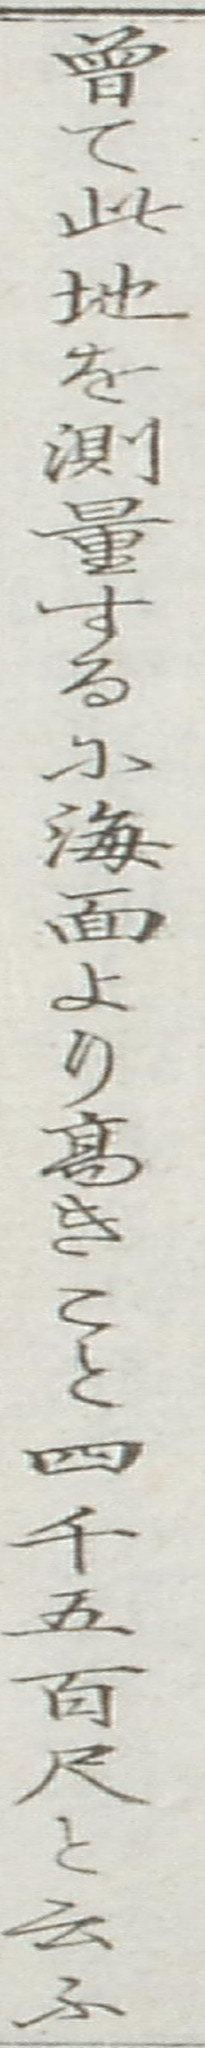曽て此地を測量するに海面より高きこと四千五百尺と云う
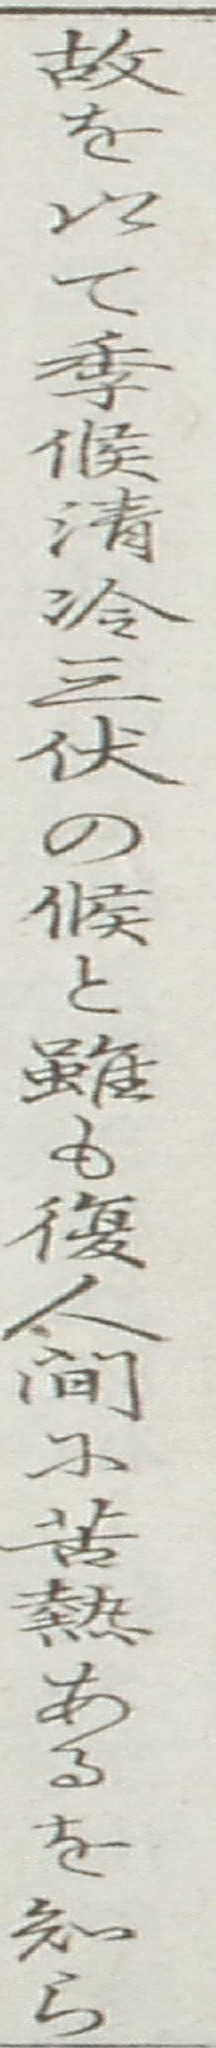故を以て季候清冷三伏の候と雖も復人間に苦熱あるを知ら
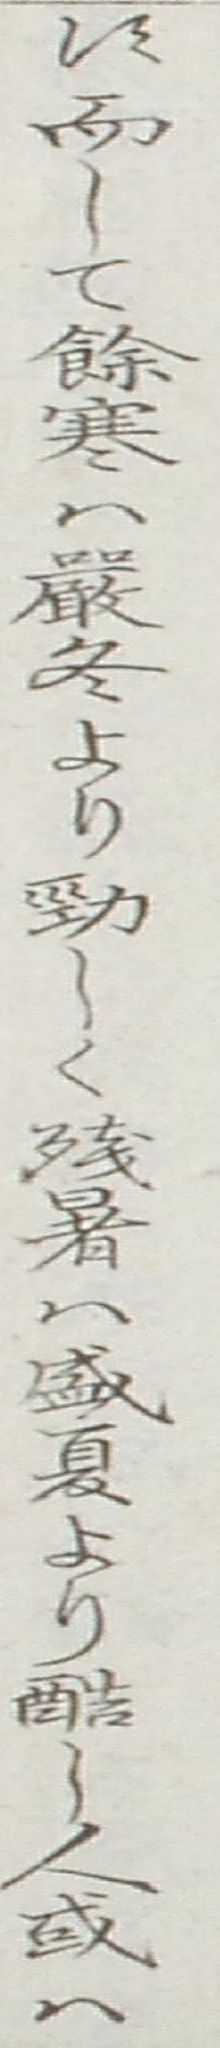す而して余寒は厳冬より勁しく残暑は盛夏より酷し人或は

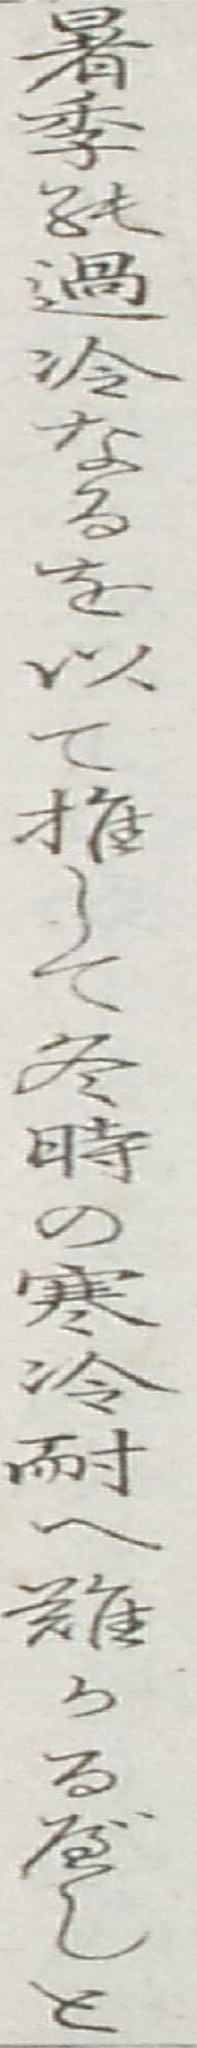暑季にも過冷なるを以て推して冬時の寒冷耐へ難かるべしと
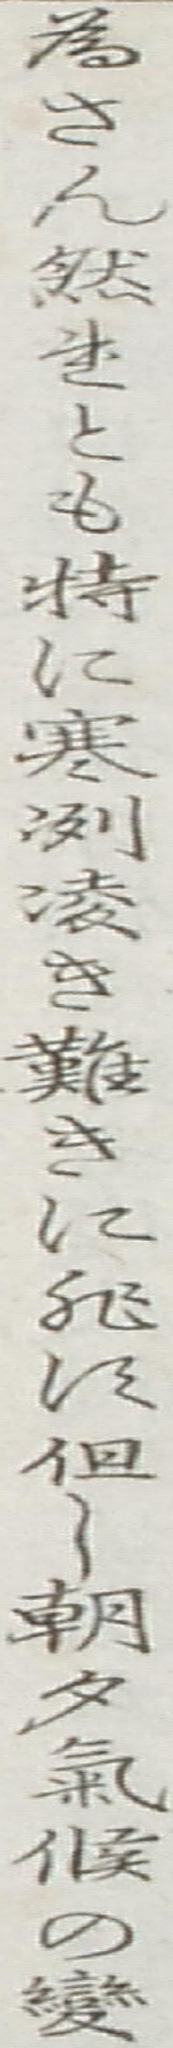為さん然れとも特に寒冽凌き難きに非す但し朝夕気候の變
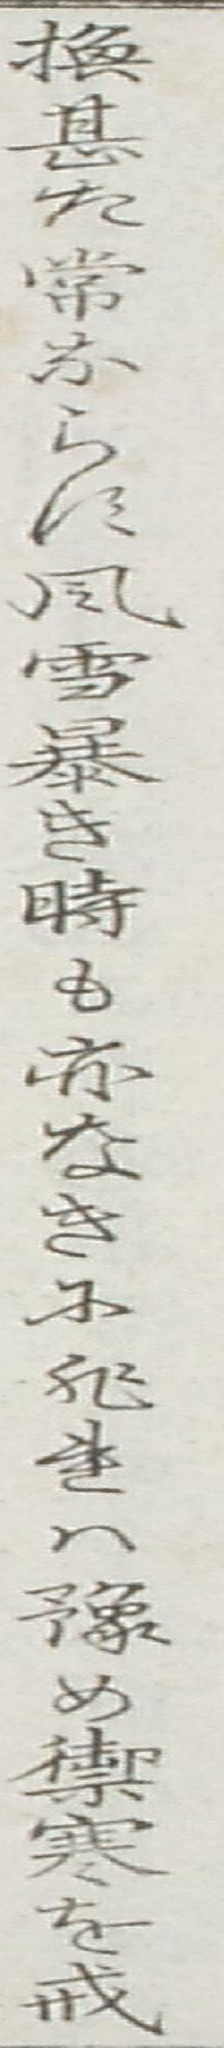換甚た常ならす風雪暴き時も亦なきに非れは豫め禦寒を戒
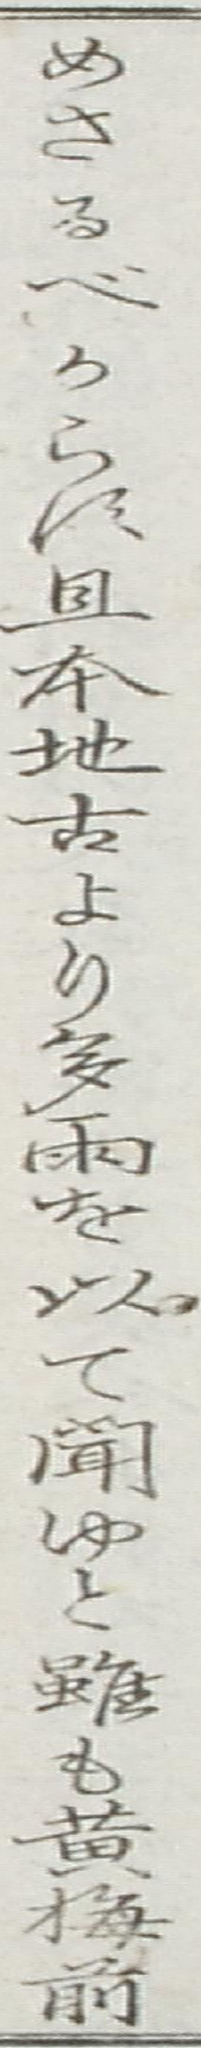めさるべからす且本地古より多雨を以て聞ゆと雖も黄梅前
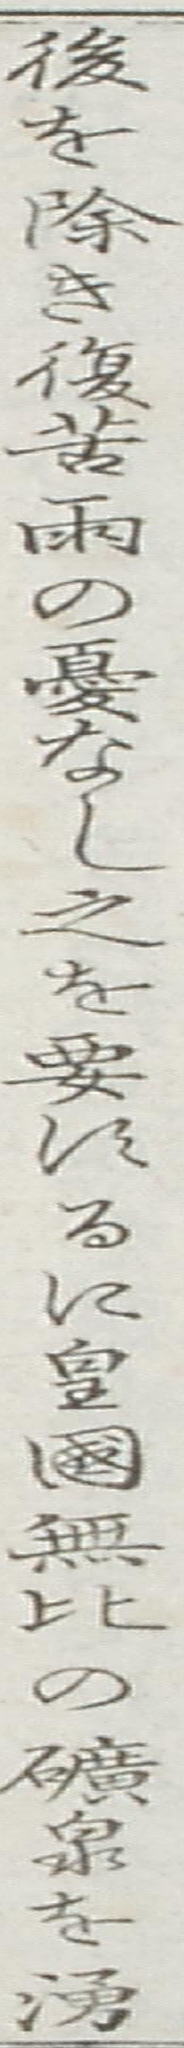後を除き復苦雨の憂なし之を要するに皇國無比の礦泉を湧
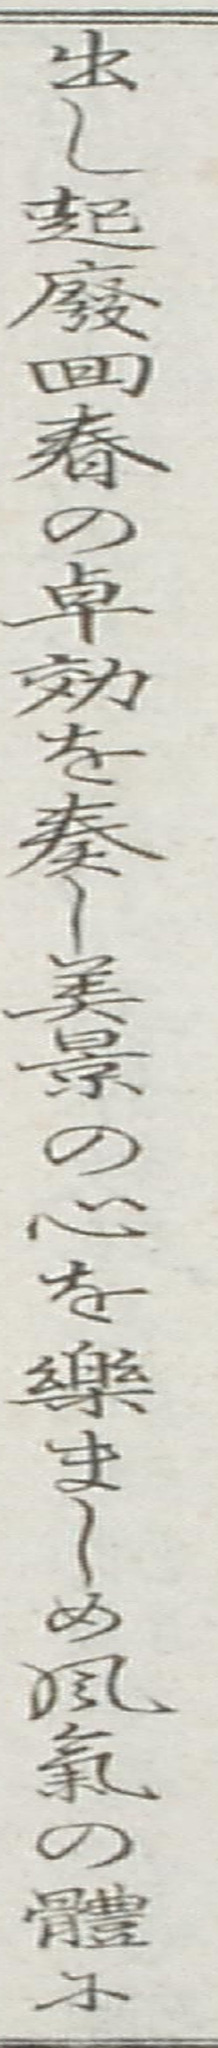出し起廢回春の卓効を奏し美景の心を楽ましめ風氣の體に
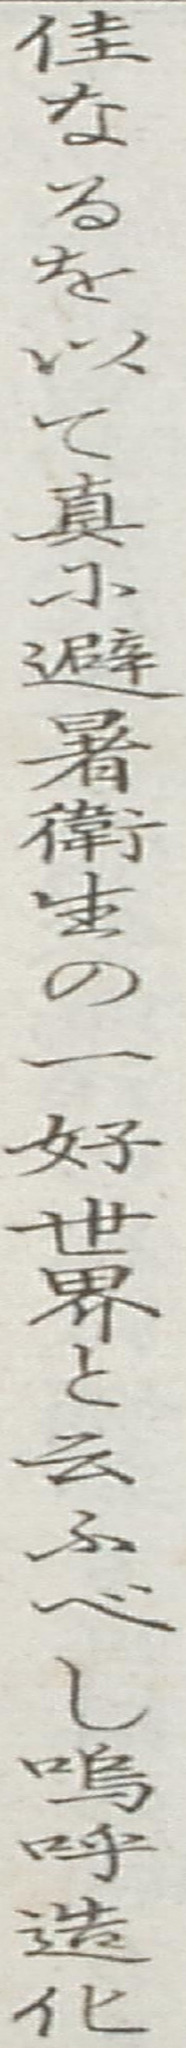佳なるを以て真に避暑衛生の一好世界と云ふべし嗚呼造化
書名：草津温泉誌　全
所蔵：東京大学地震研究所図書室 Earthquake Research Institute Library, The University of Tokyo, JAPAN
